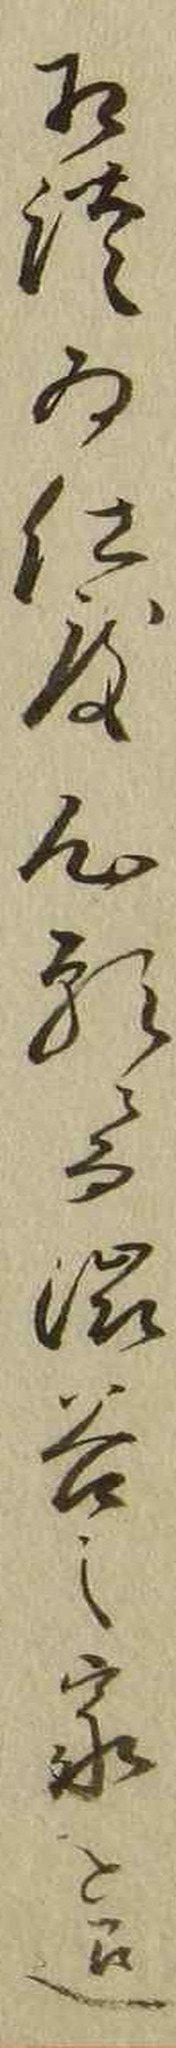相談為仕度心願ニ而渋谷之家を退
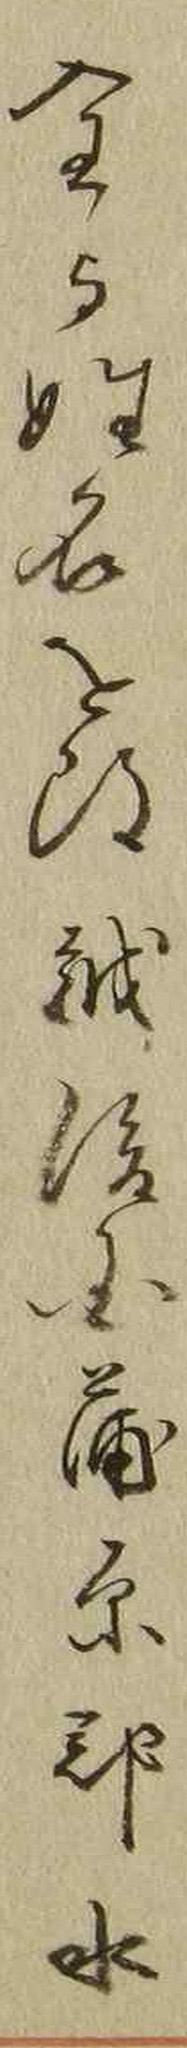全と姓名を改越後国蒲原郡水
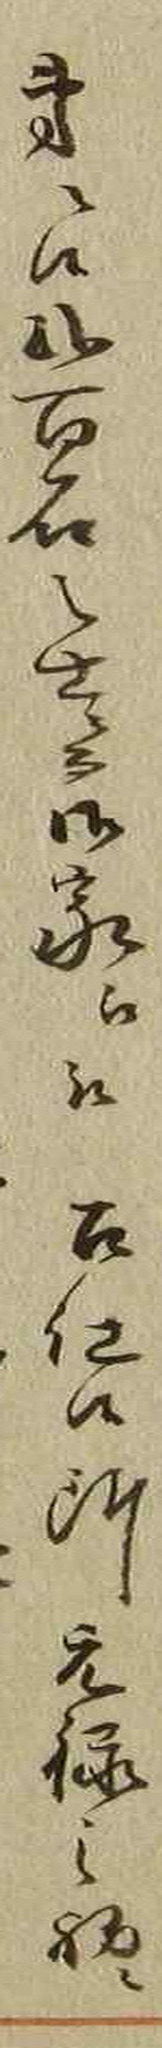弟ニ候弐百石之士ニ而御家江被召仕候所元禄之初ニ
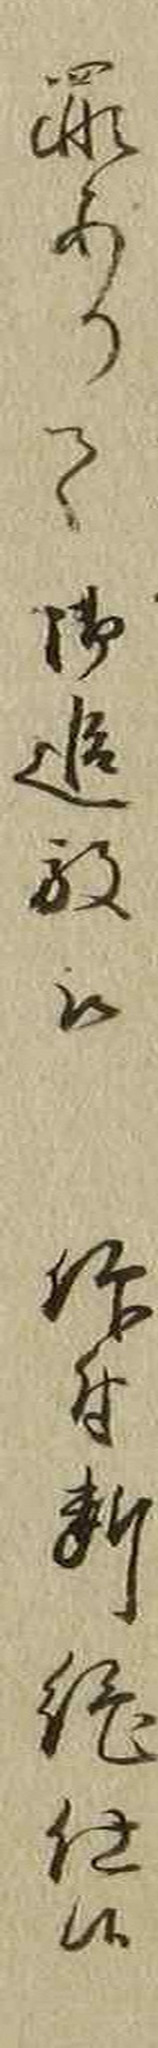罪ありニて御追放被仰付断絶仕候
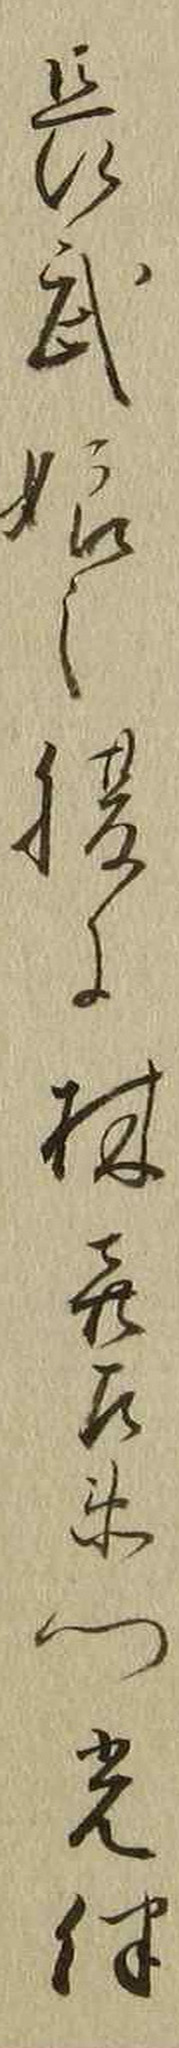長武娘之腹ニ林喜左衛門光伴
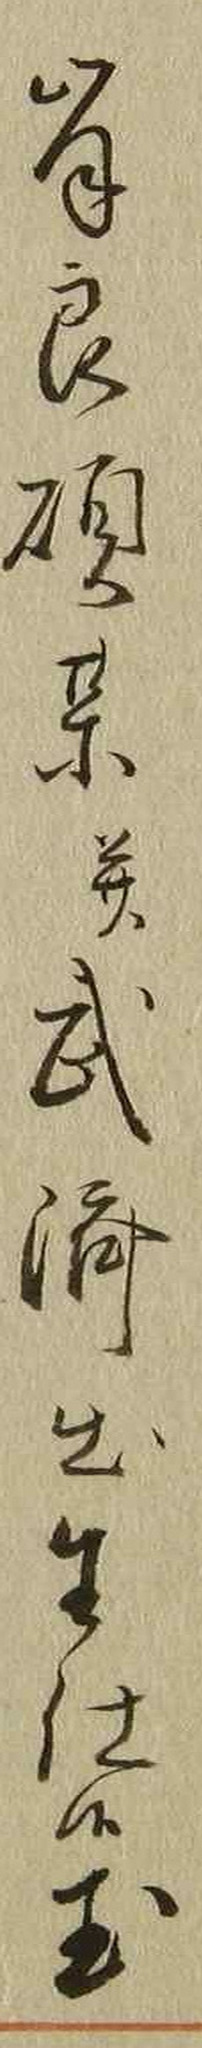岸良碩某并武濟出生仕候玉
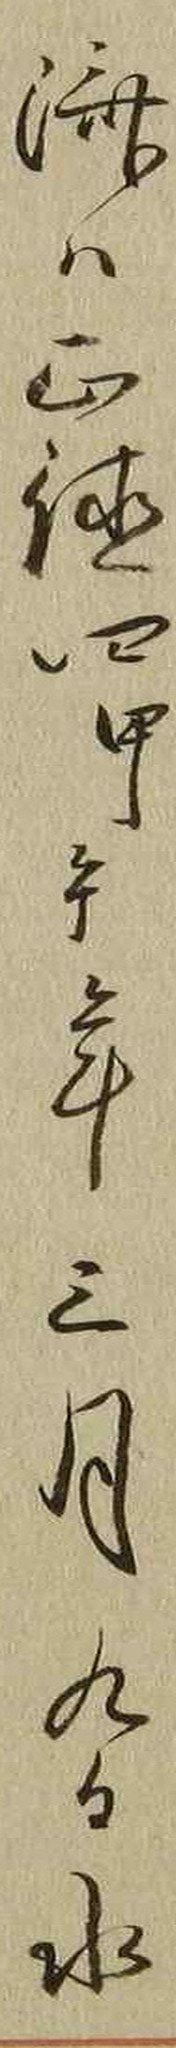濟ハ正徳四申午年三月九日水
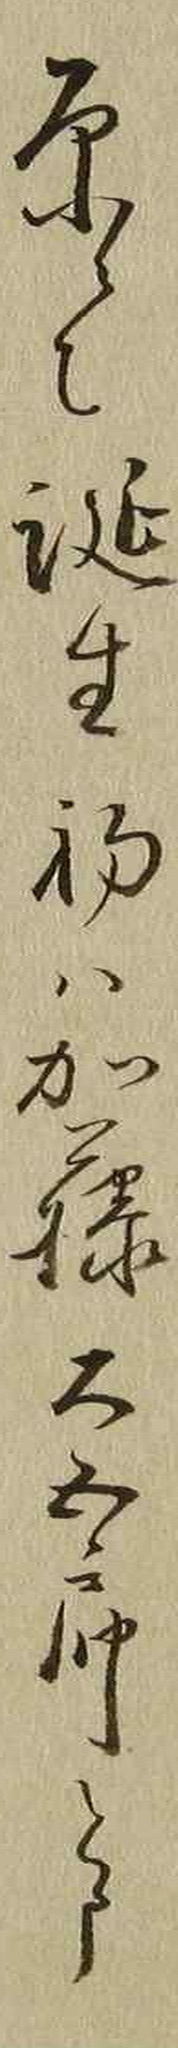原にて誕生初ハ加藤大五郎と申
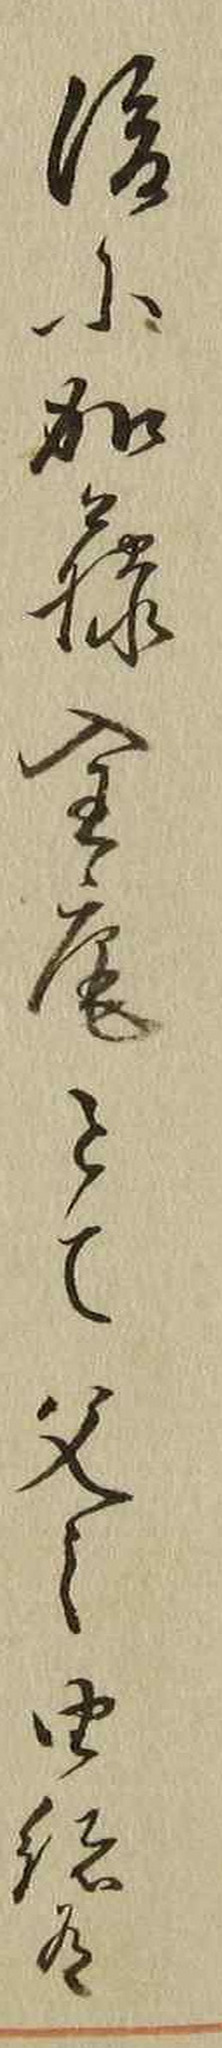後に加藤全庵とて父之由緒有
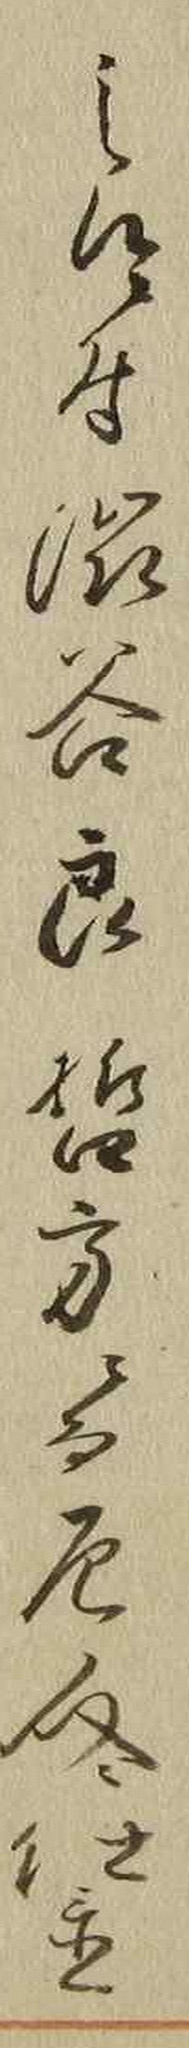之候ニ付渋谷良哲方ニ而厄介ニ仕置
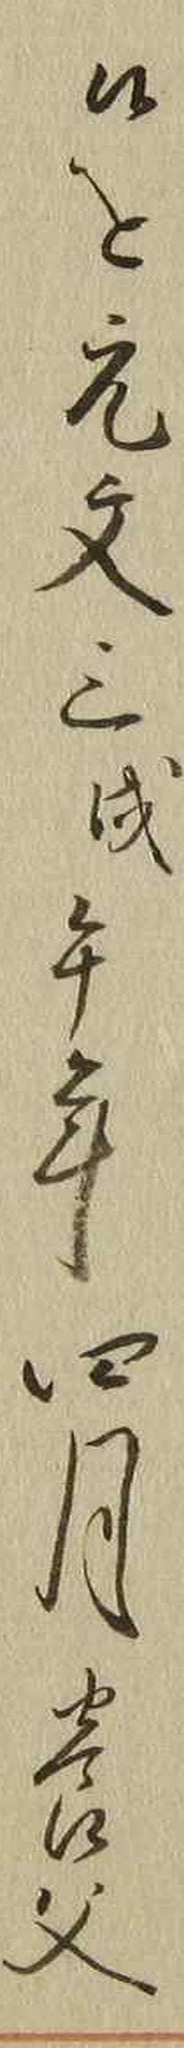候を元文三戌午年四月養父
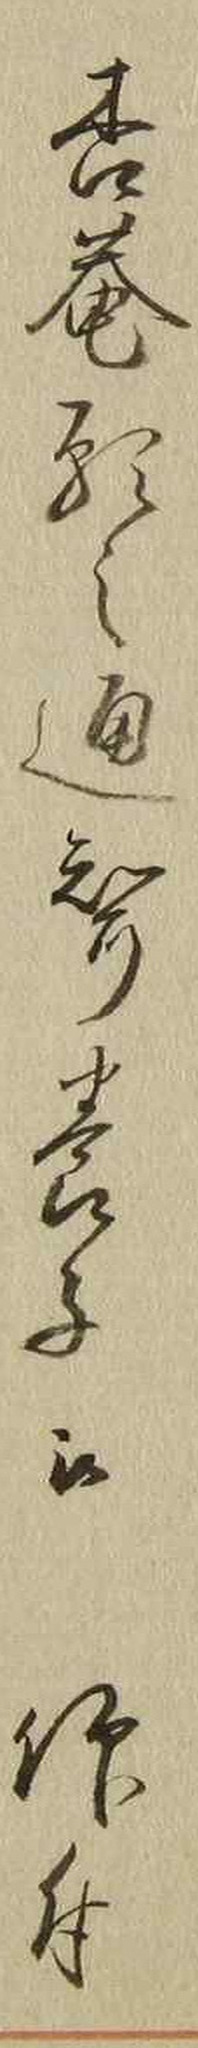杏庵願之通聟養子被仰付
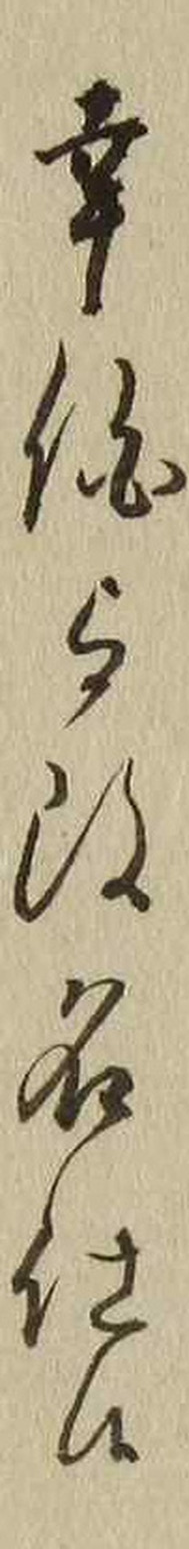幸伯と改名仕候
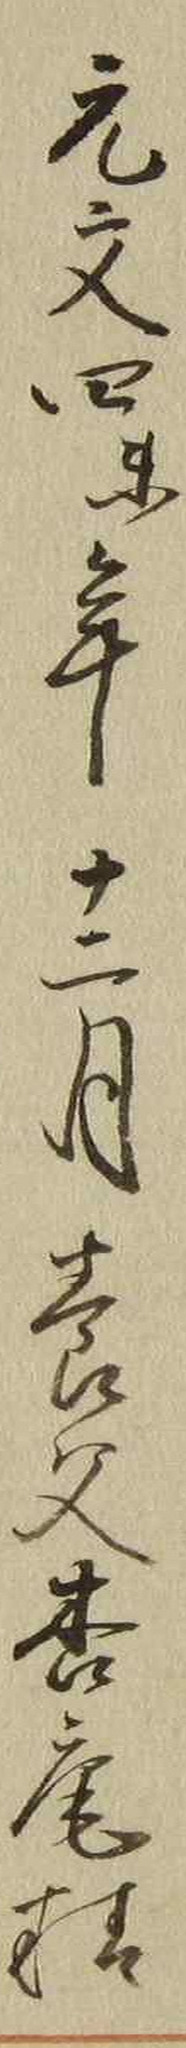元文四未年十二月養父杏庵精
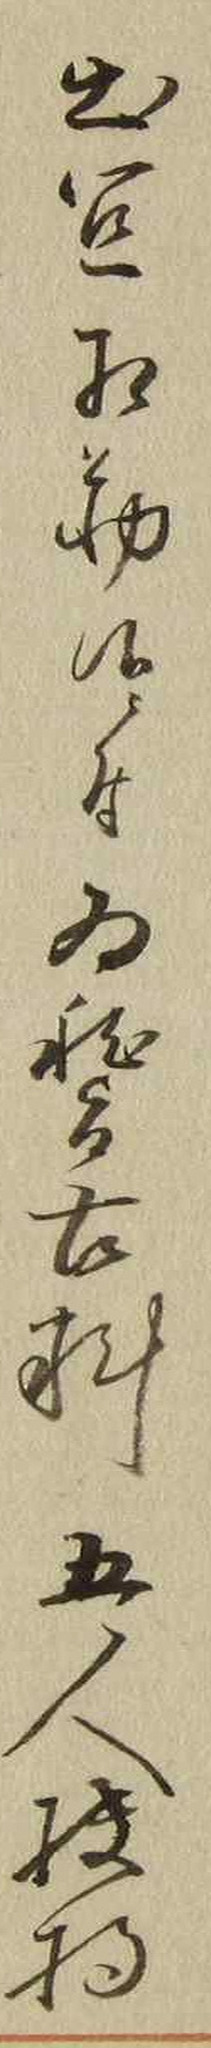出宜相勤候ニ付為稽古料五人扶持
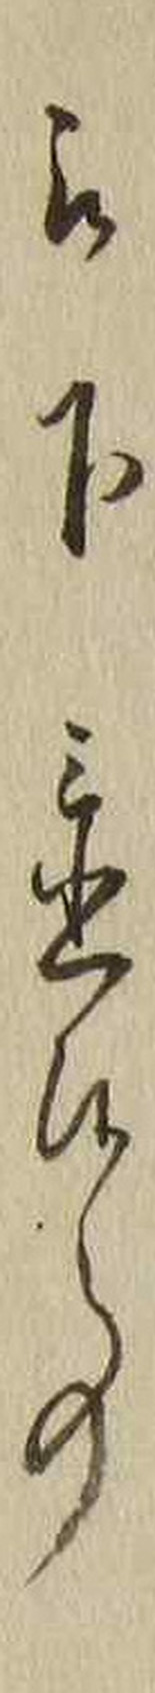被下置候事
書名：諸士系譜　巻之68　を之部2
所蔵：会津若松市立会津図書館
